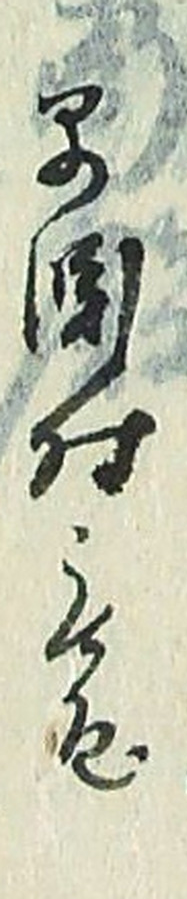矢ノ村庄屋
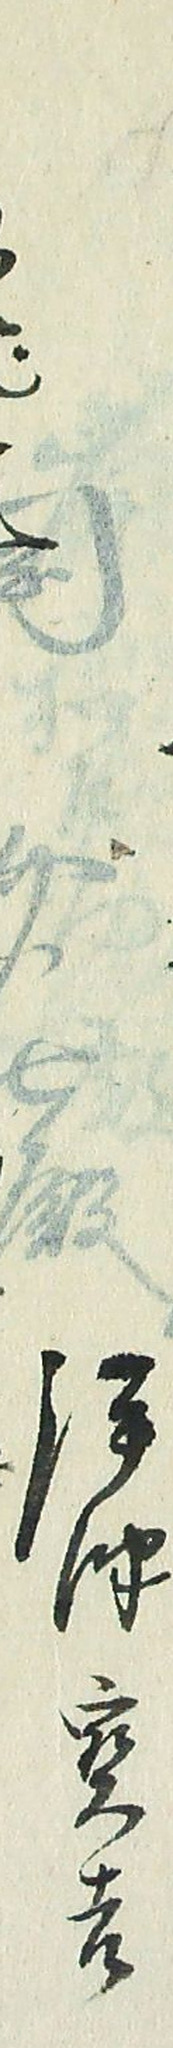伊沢宝吉
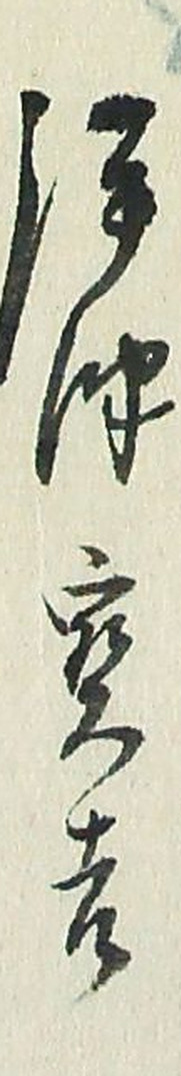伊沢宝吉
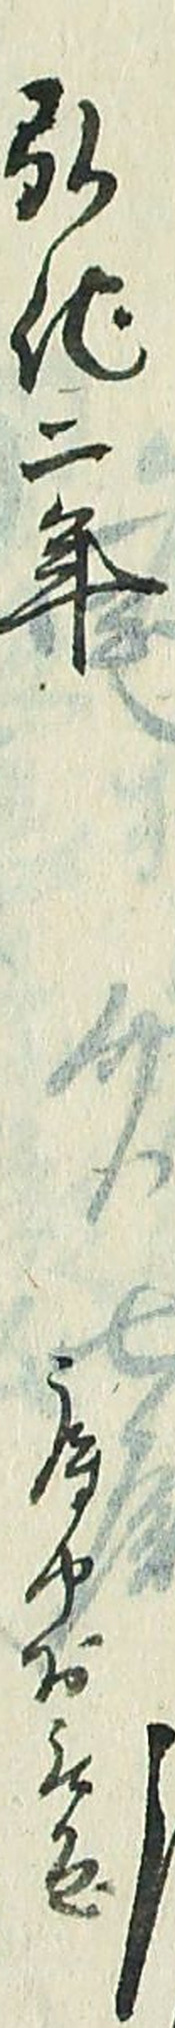弘化二年府中村庄屋
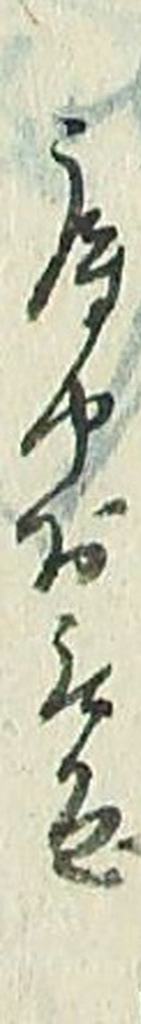矢ノ村庄屋
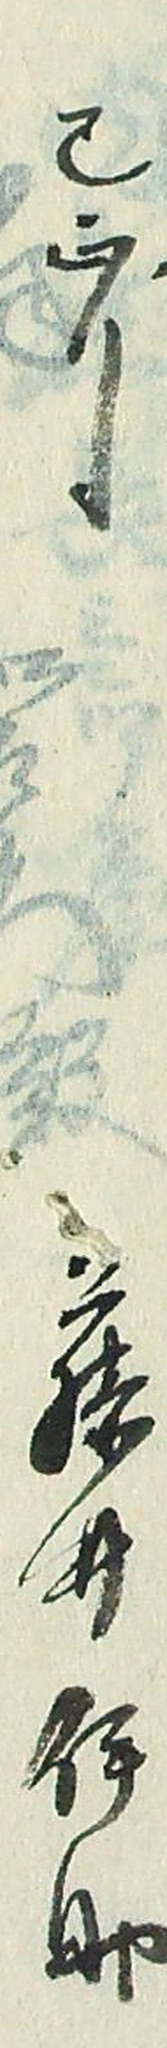巳正月藤井伊助
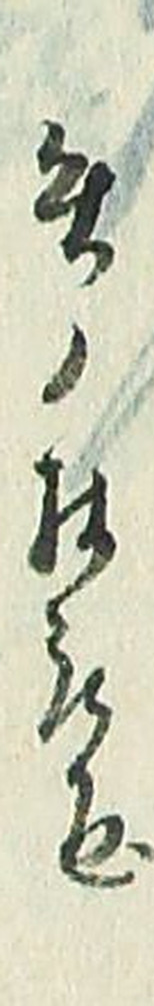矢ノ村庄屋
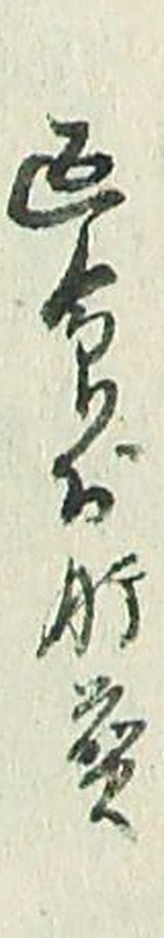延命村肝煎
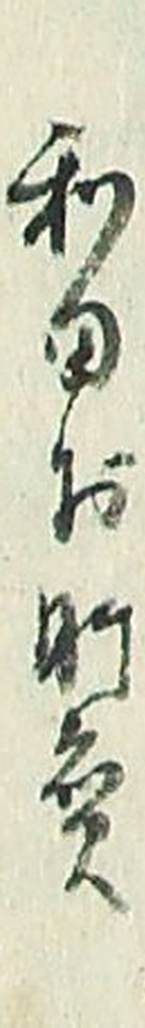和田村肝煎

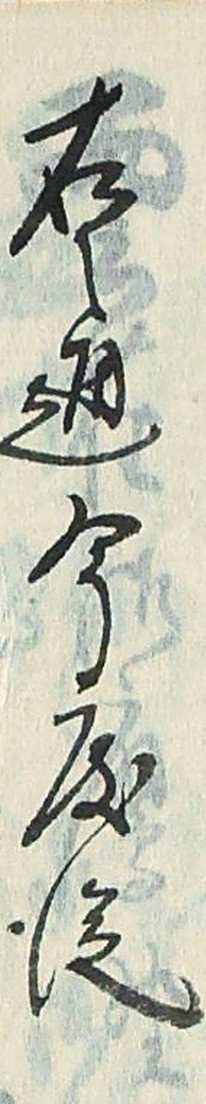右之通今度従
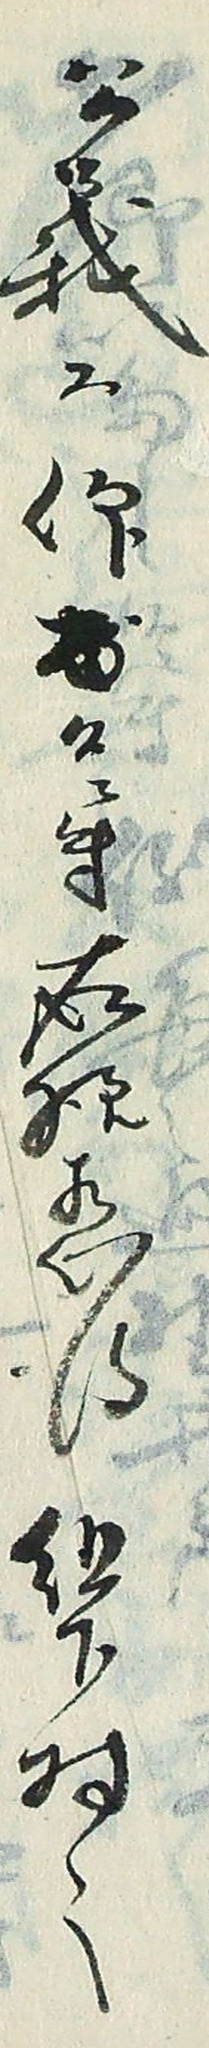公義被仰出候に付き右様相心得組下村々
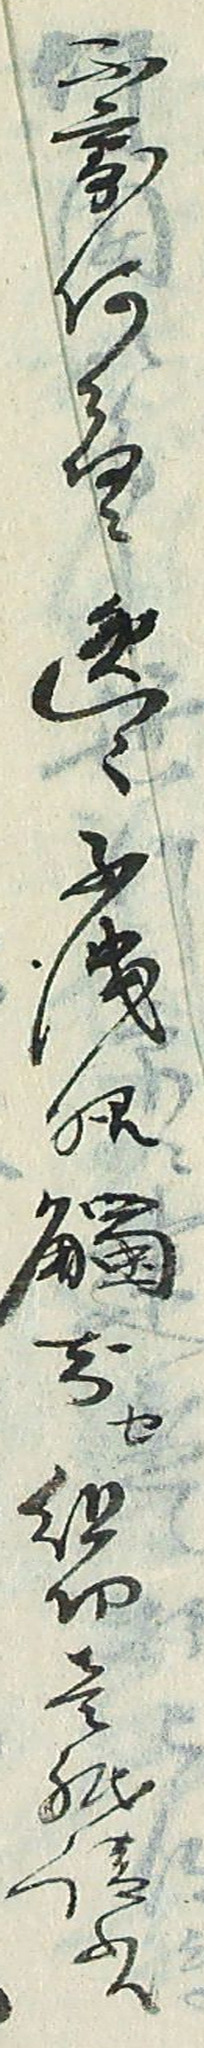不寄何者に逸々不洩様触知せ組切壱紙請書
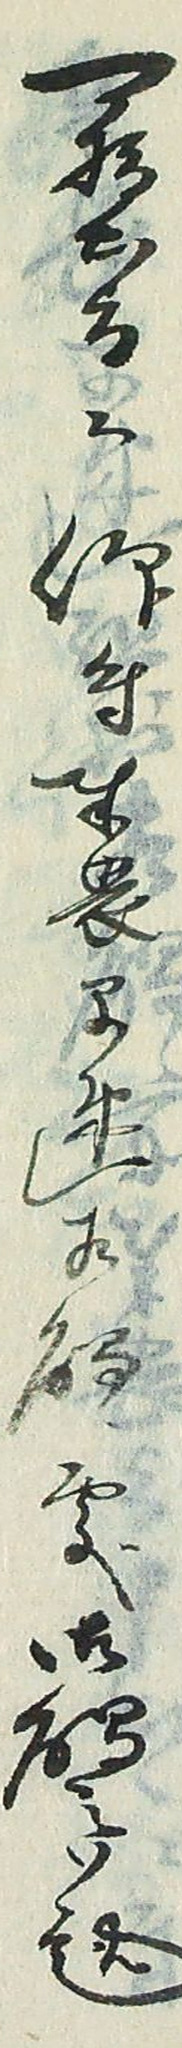可指出旨被仰付奉畏早速相触候処御触之御趣
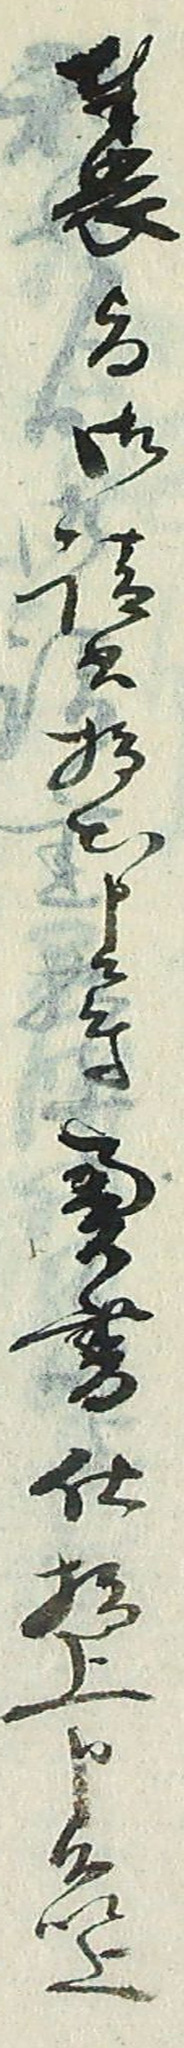奉畏旨御請書指出申に付奥書仕指上申候以上
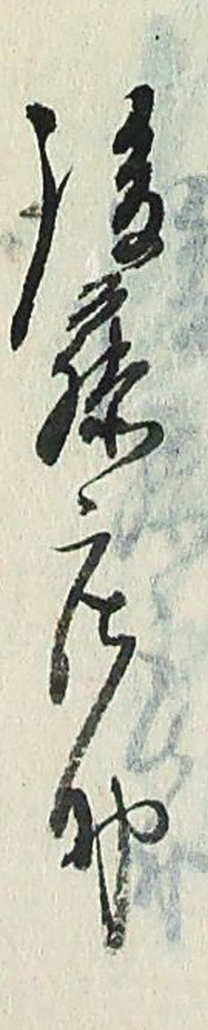後藤庄助
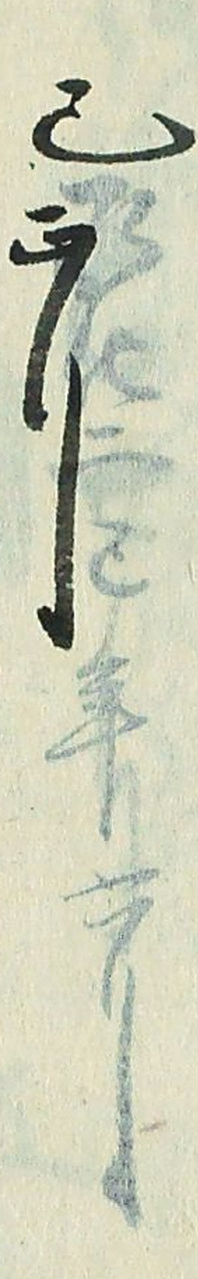巳正月
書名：諸御用御□受書控
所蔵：鳴門教育大学 Naruto University of Education
